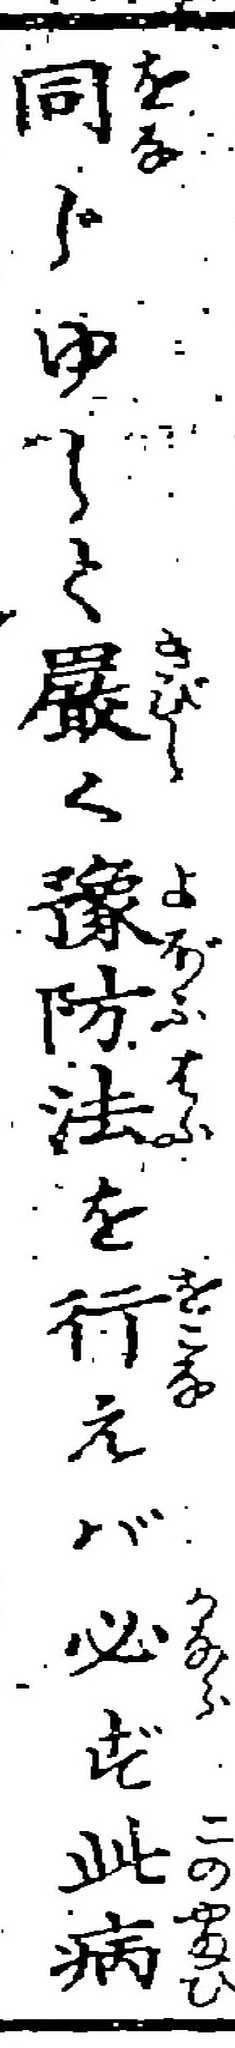同じゆしく厳く予防法を行えば必ず此病
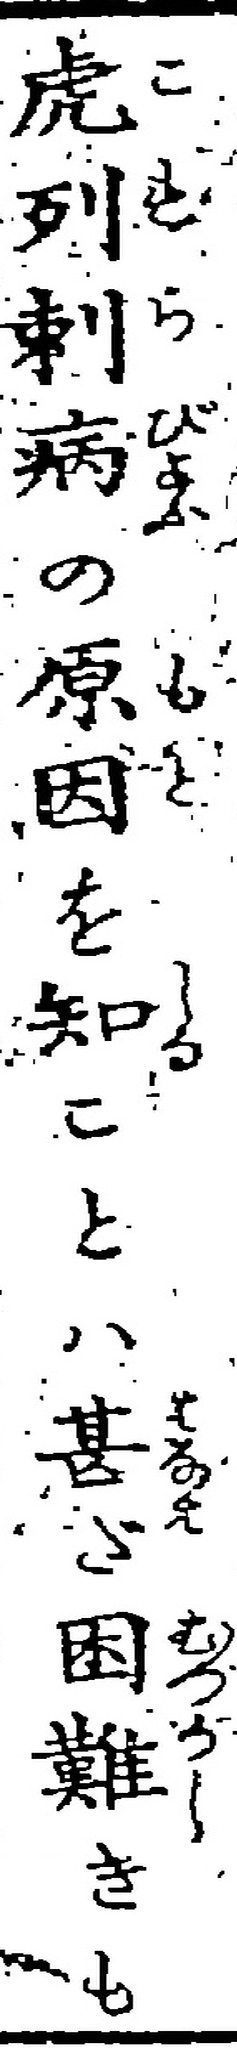虎列刺病の原因を知ことは甚だ困難きも
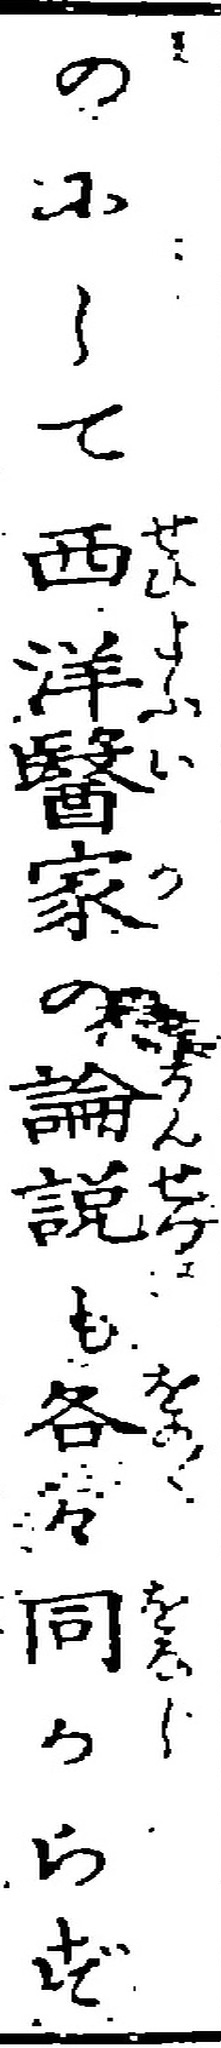のにして西洋医家の論説も各々同からず
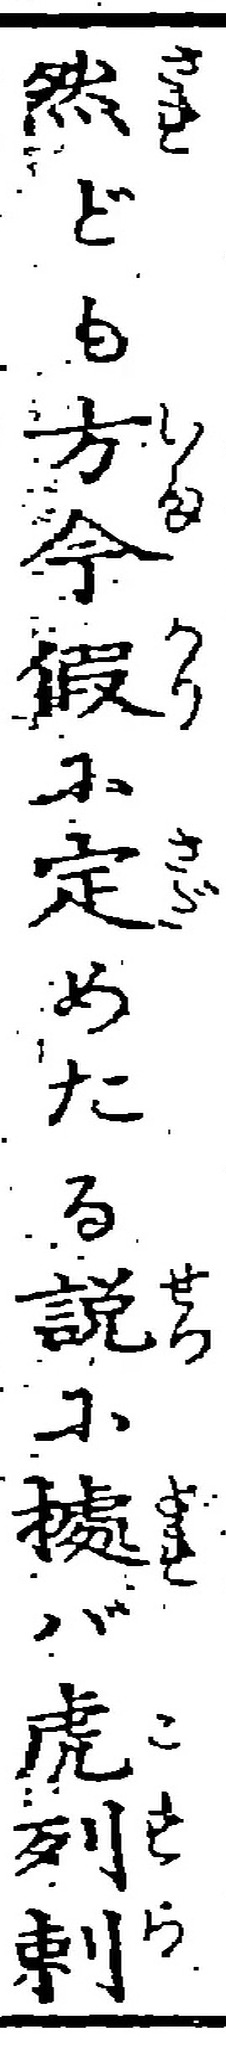然ども方令仮に定めたる説に拠ば虎列刺
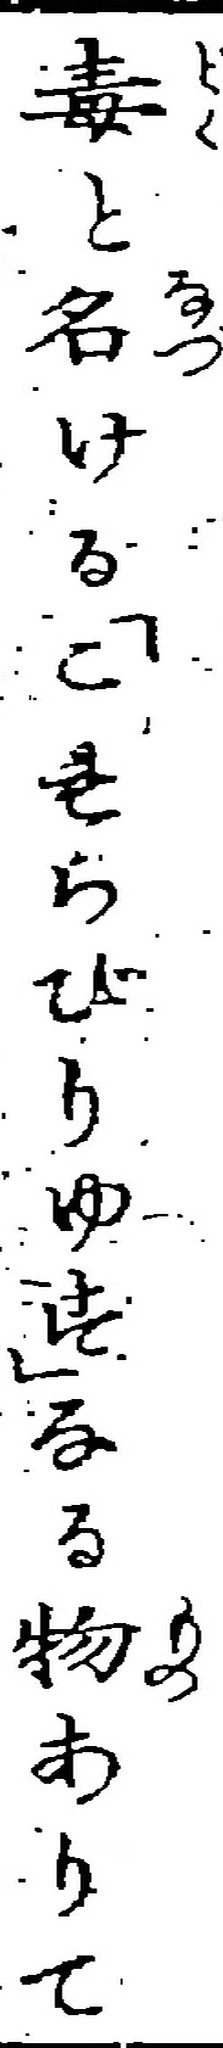毒と名ける「これらびりゆす」なる物ありて
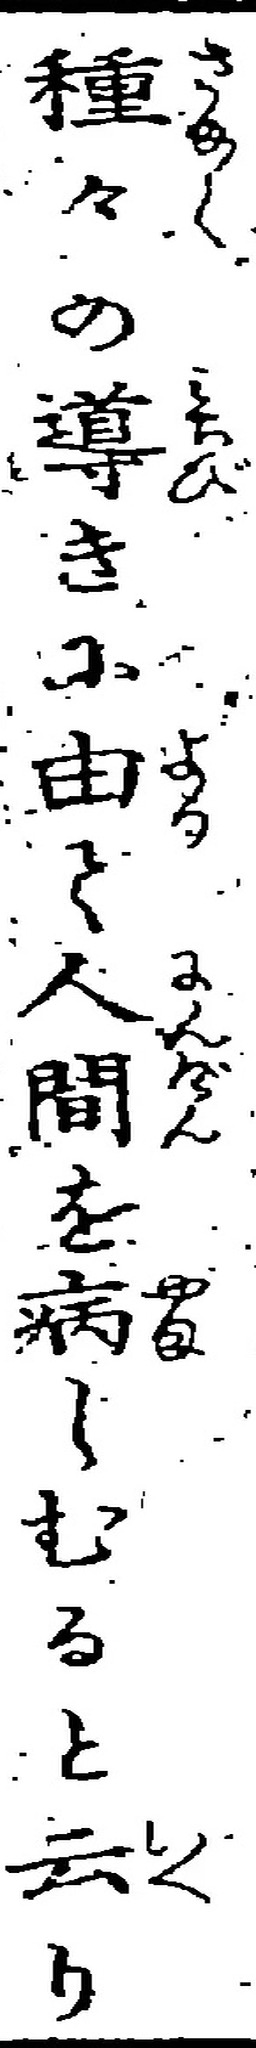種々の導きに由て人間を病しむると云り
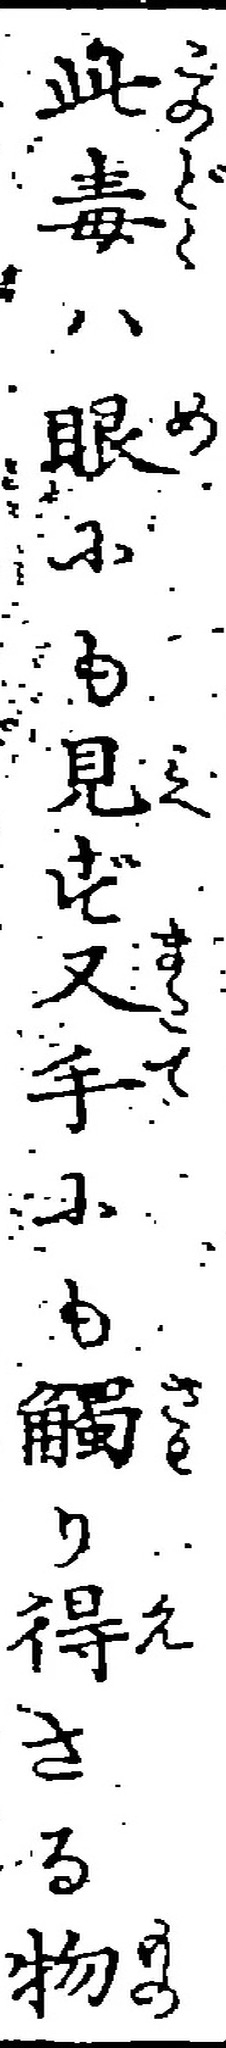此毒は眼にも見ず又手にも触り得さる物
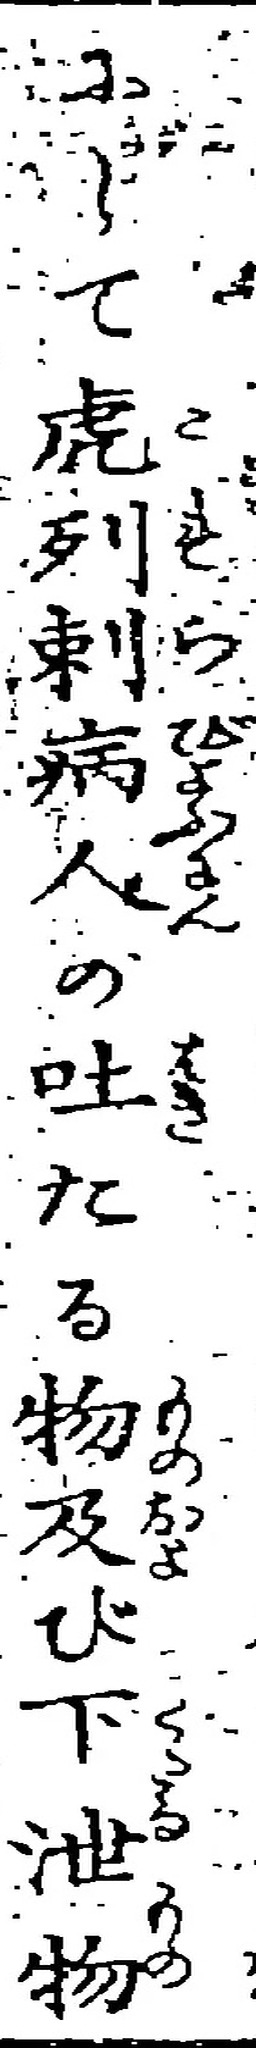にして虎列刺病人の吐たる物及び下泄者
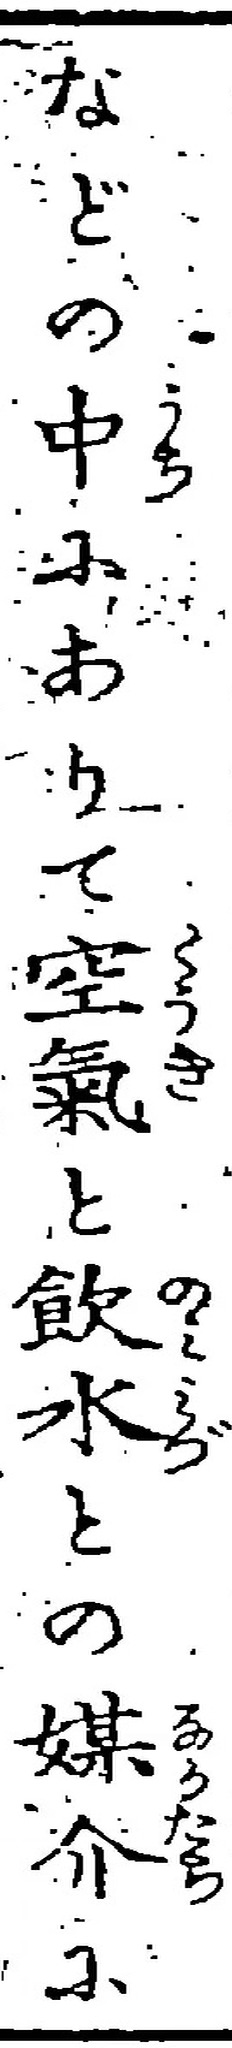などの中にありて空気と飲水との媒介に
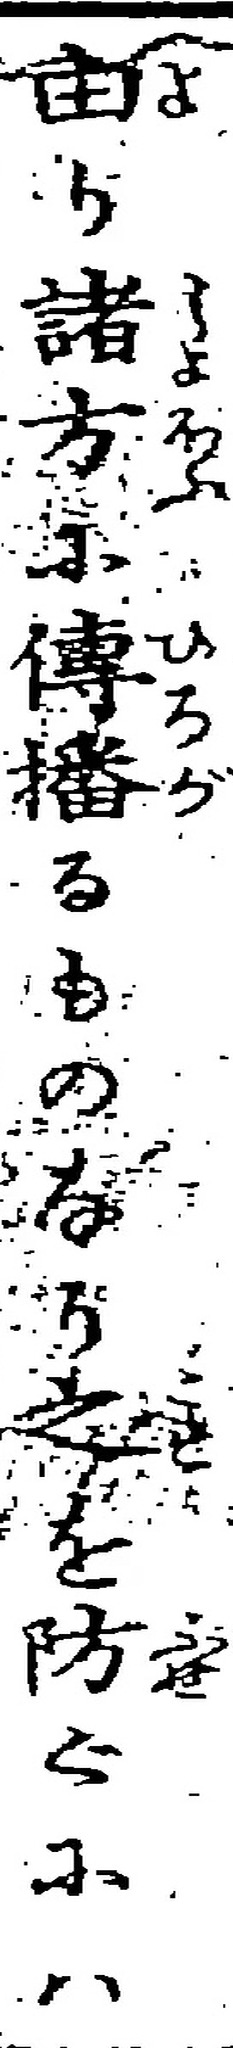由り諸方に伝播るものなり之を防ぐには

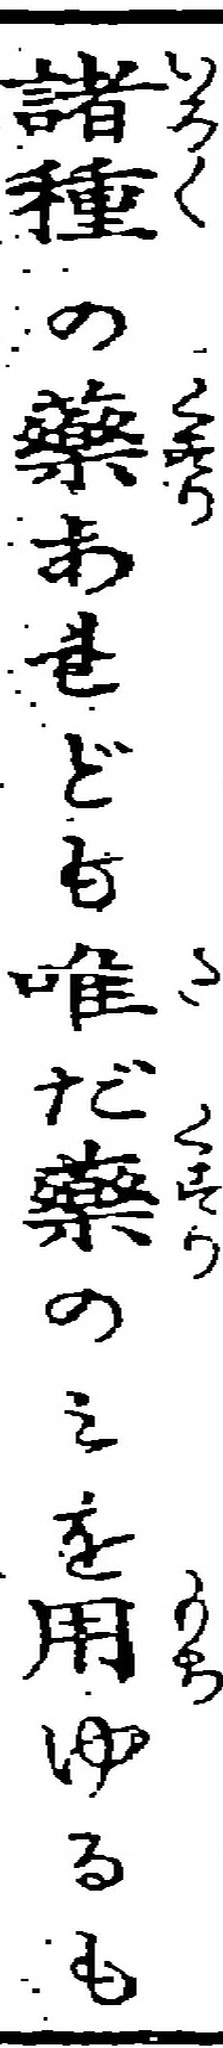諸種の薬あれども唯だ薬のみを用ゆるも
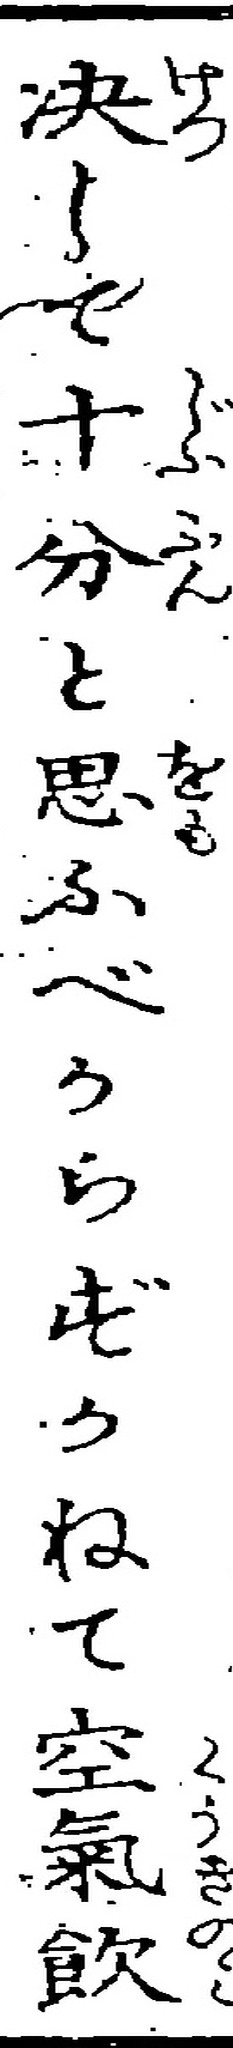決して十分と思ふべからずかねて空気飲
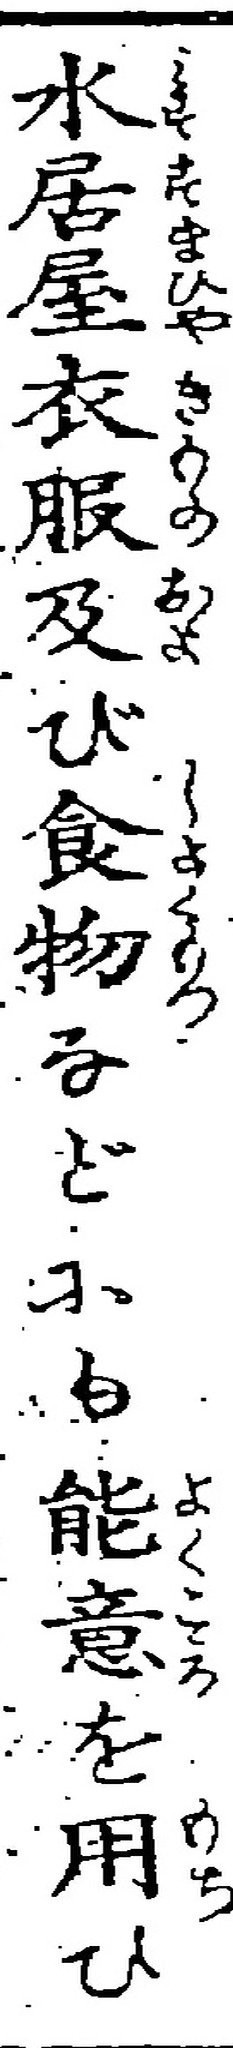水居屋衣服及び食物などに能意を用ひ
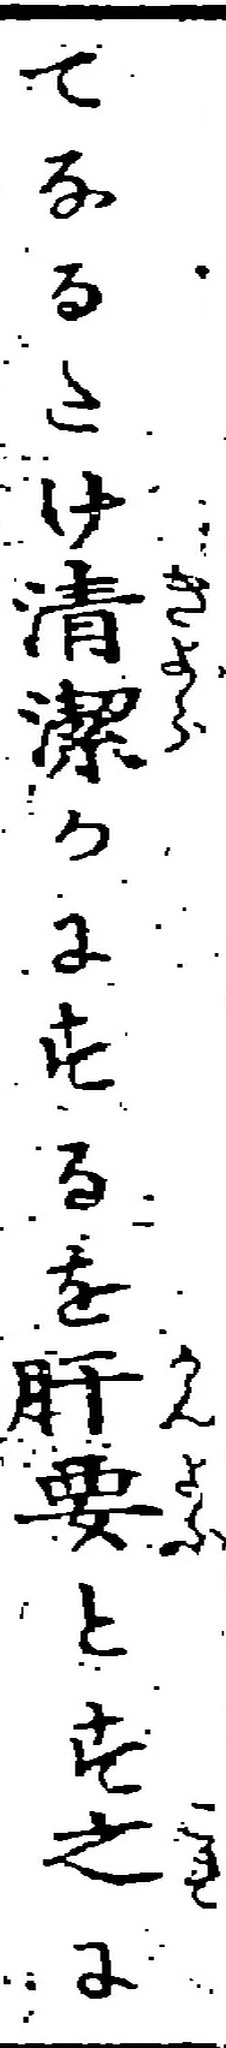てなるたけ清潔かにするを肝要とす之に
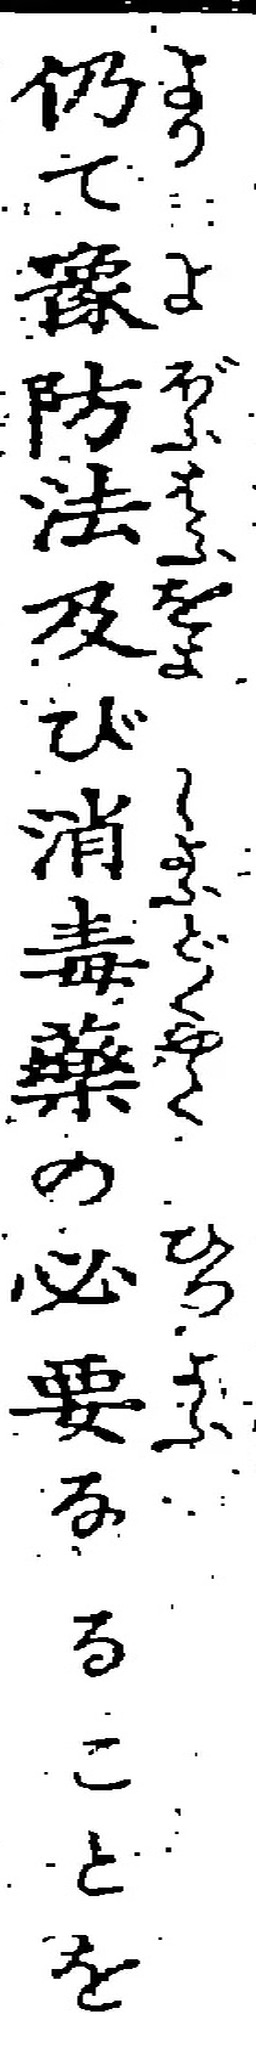仍て予防法及び消毒薬の必要なるなることを
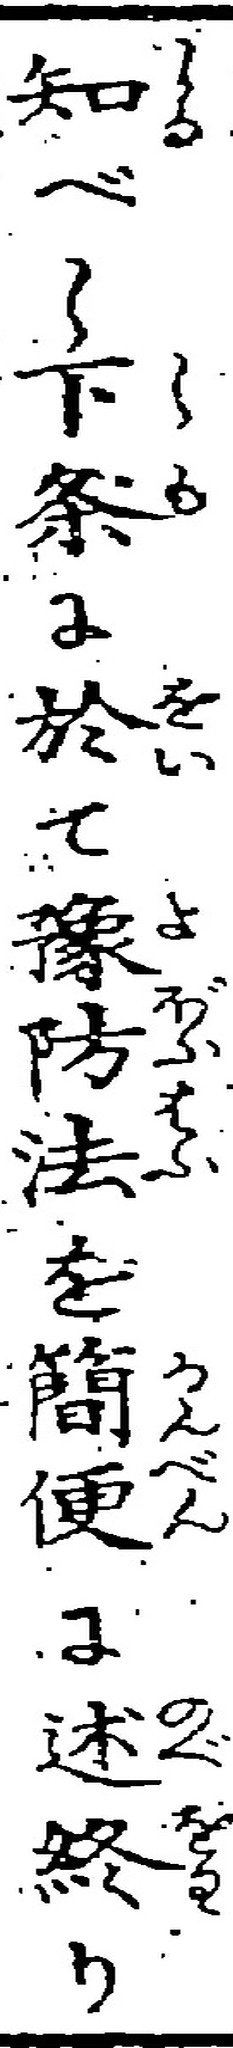知べし下条に於て予防法を簡便に述終り
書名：コレラ予防命乃後見
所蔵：国立国会図書館 National Diet Library, JAPAN
